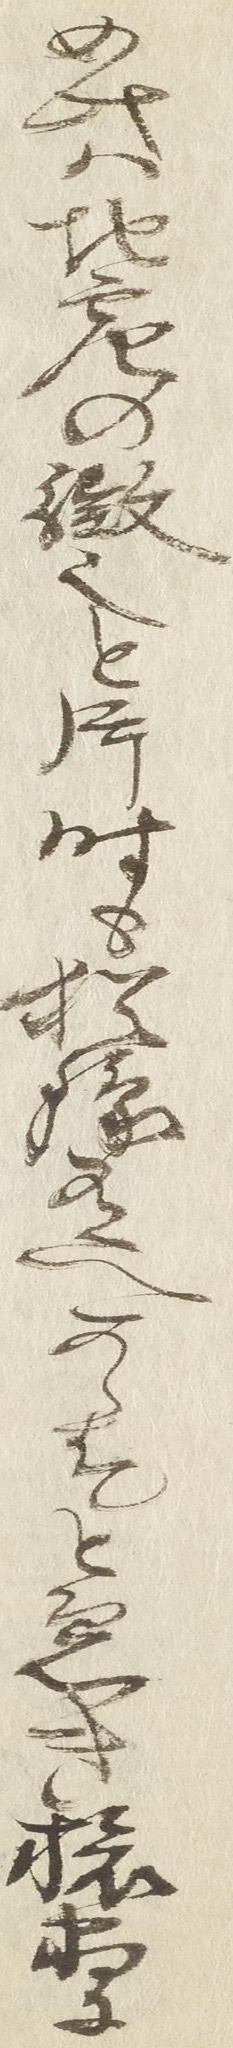如此は地震の徴也と片時も猶予有へからずと急き旅宿に
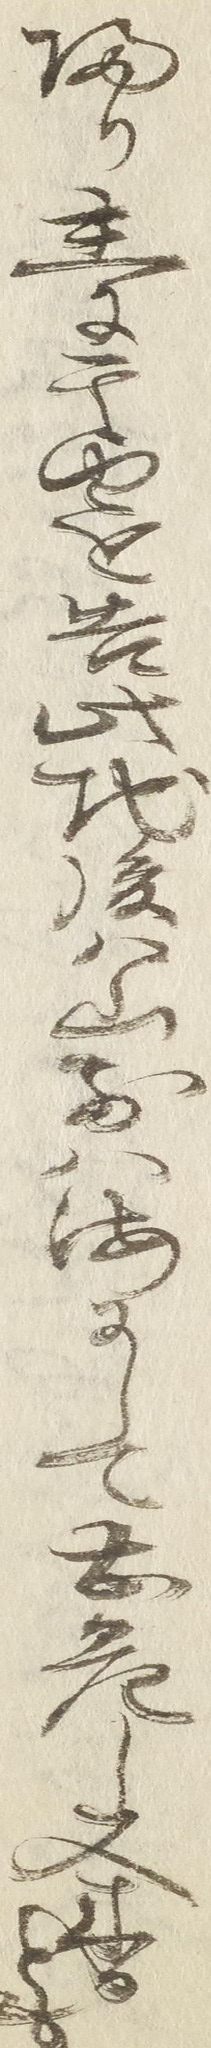帰り主に其由を告此地後は山前は海にして甚危し又来るとも
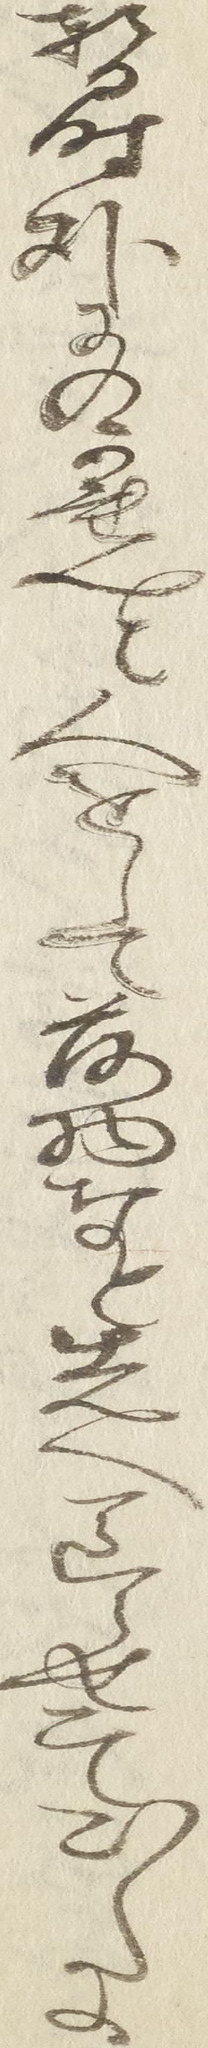暫時外にのがれんと人をして荷物なと先へ送らせそこ〳〵に
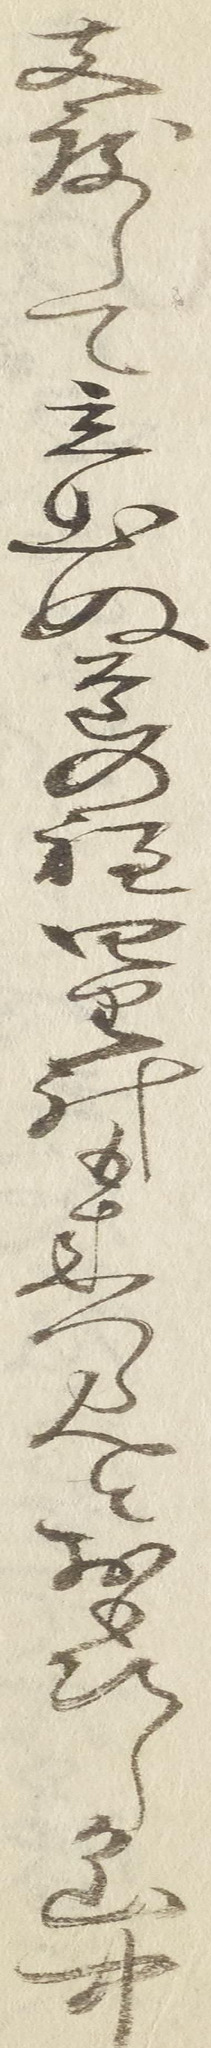支度して立出ぬ道の程四里計も来つらんとおもひしか山中
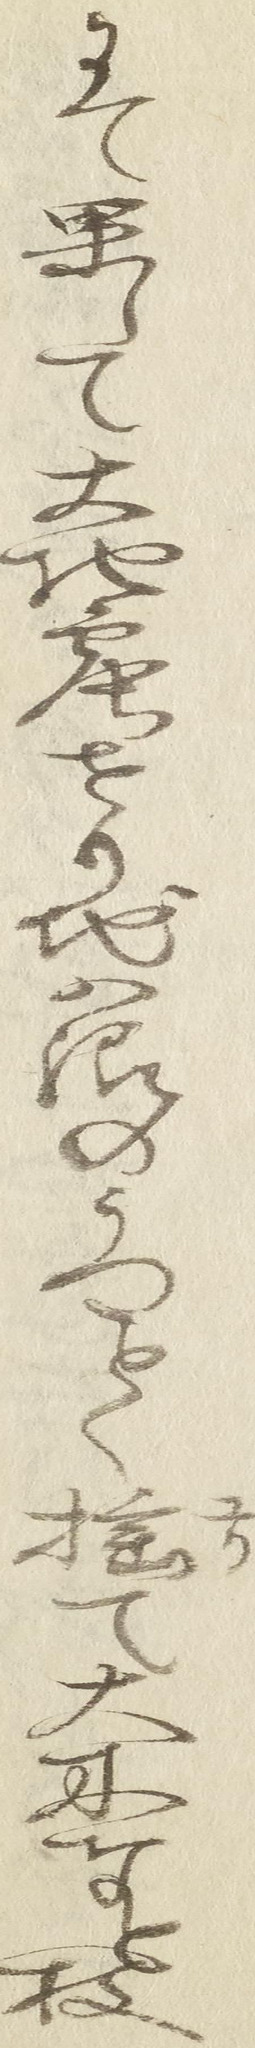にて果して大地震をこり地の浪のうつことく揺て大木なと枝
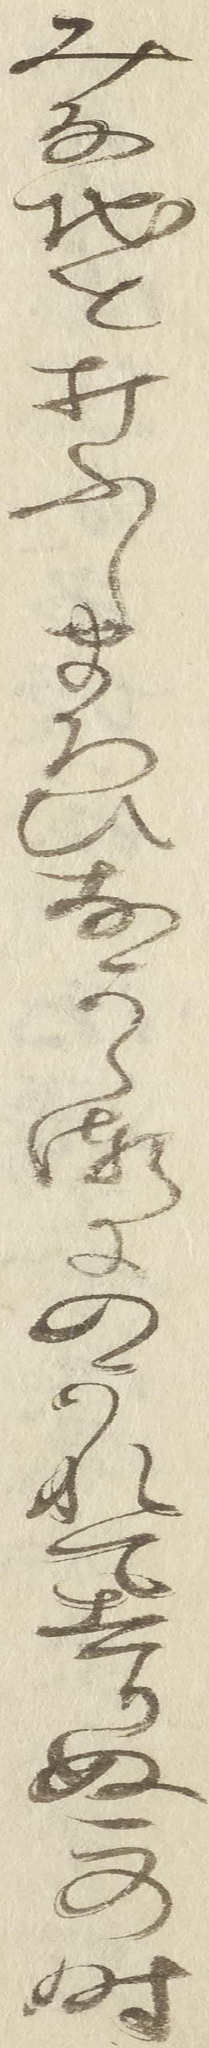みな地を打ふしまろひなから漸にのがれて去りぬこの時

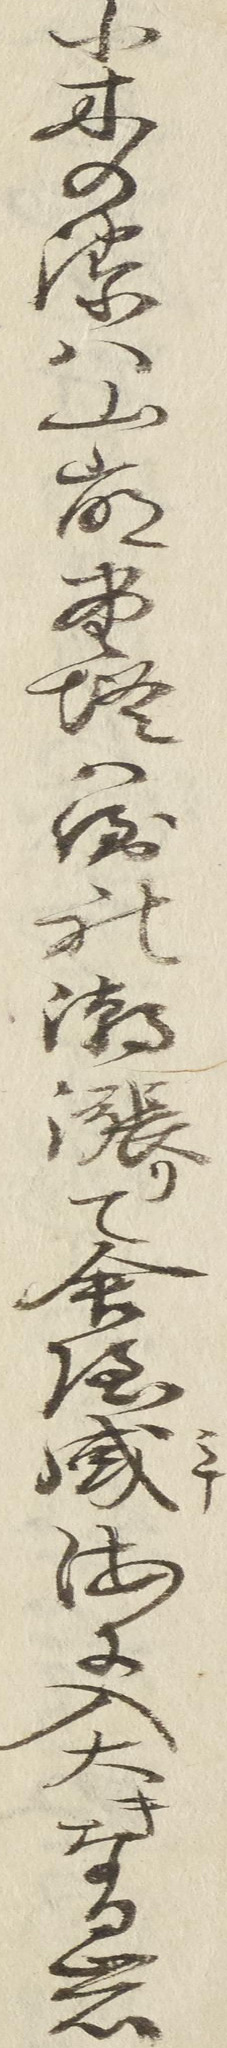小木の湊は山崩れ堂塔は倒潮漲て舎屋咸海に入大きなる岩
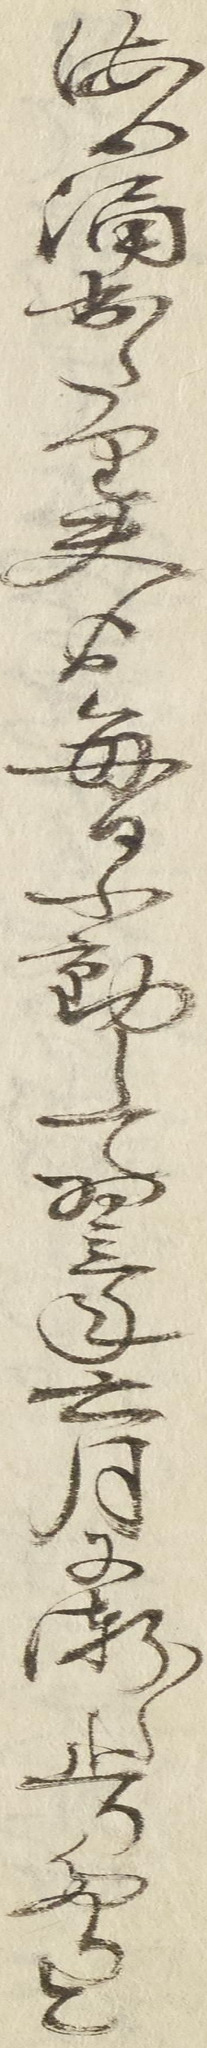海ゟ涌出たりそれゟ毎日小動して翌年六月に漸々止りたりと
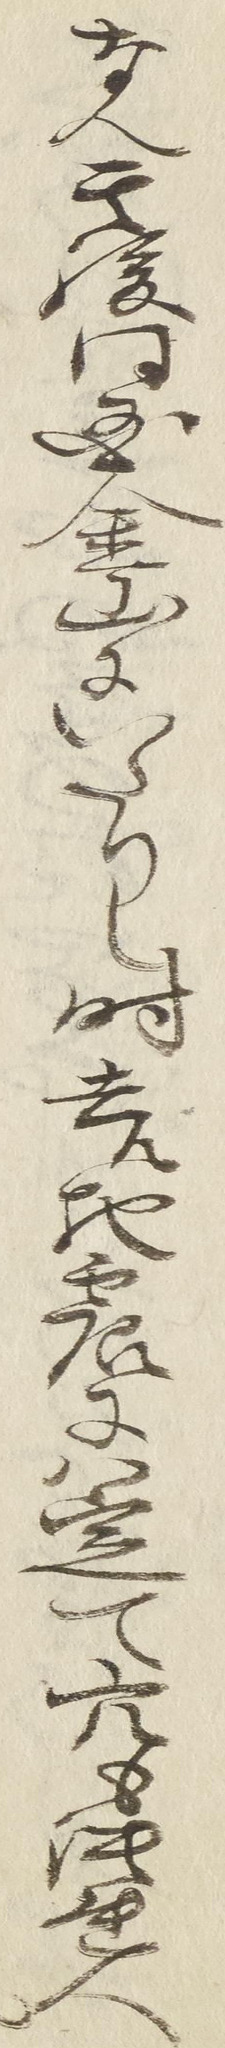なん其後同国金山にいたりし時去る地震には定て穴も潰れ人も
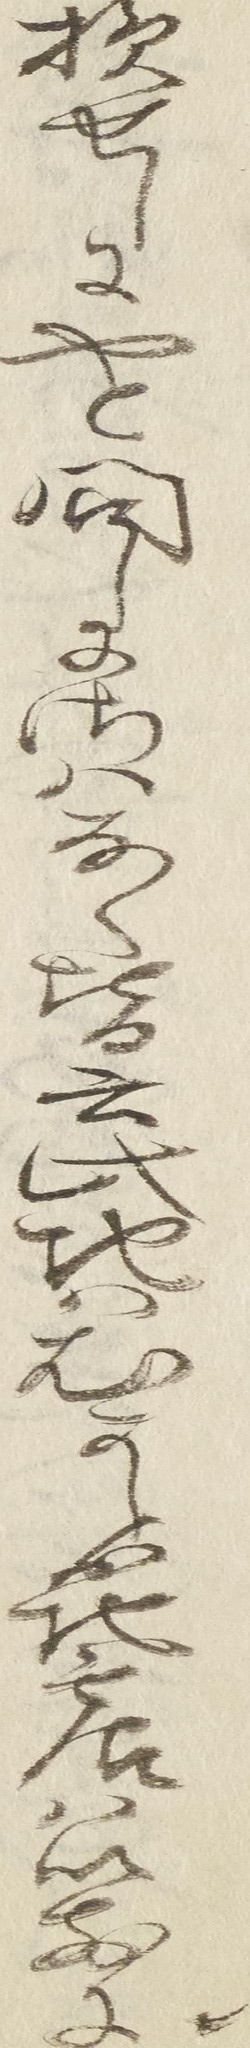損せしにやと問しにさはなく皆云此地はむかしゟ地震は以前に
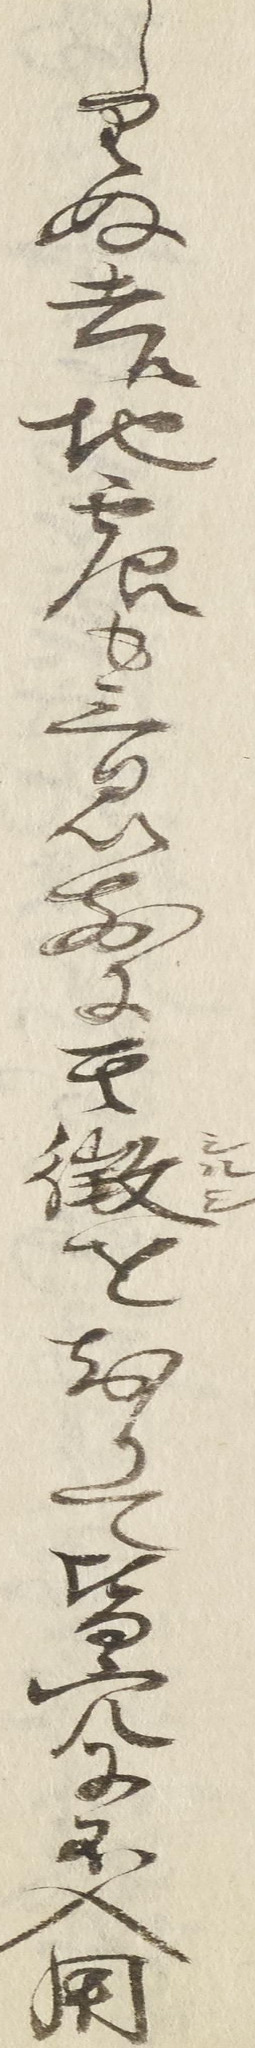しりぬ去る地震も三日以前に其徴を知りて皆穴に不入用
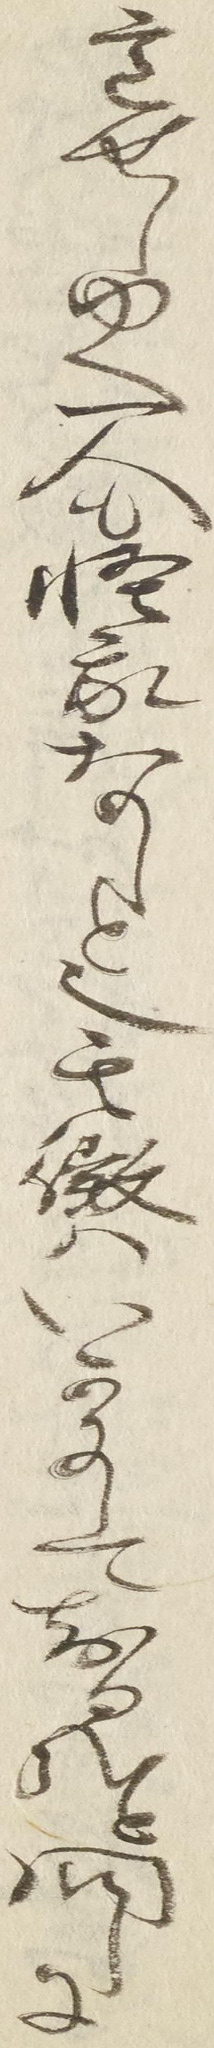意せしゆへ一人も怪我なしと也其徴はいかにして知る哉と問しに
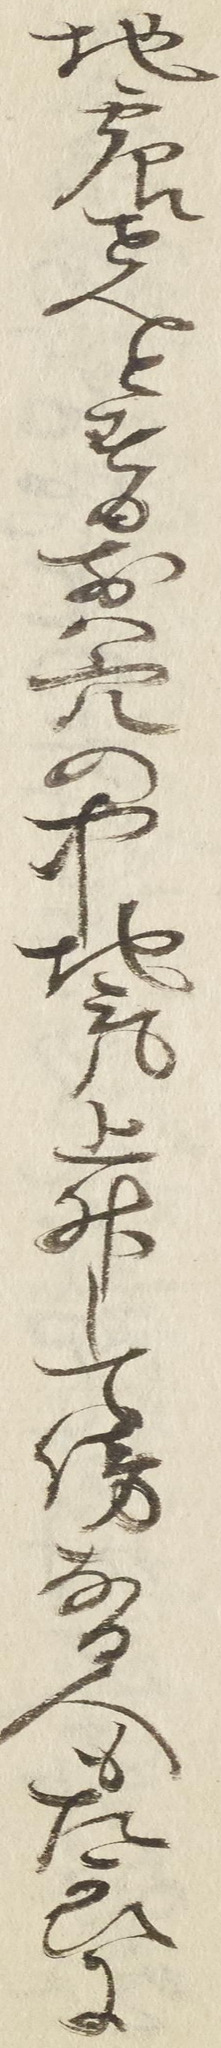地震せんとする前は穴の中地気上升して傍なる人もたがひに
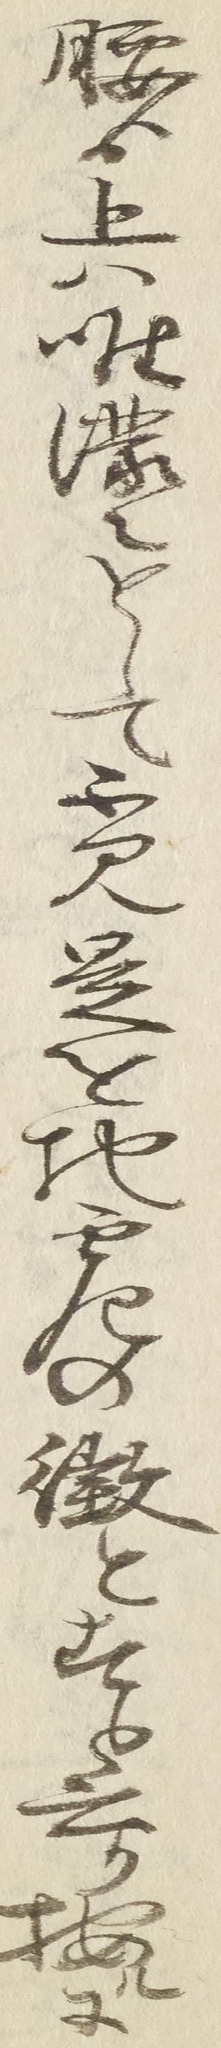腰ゟ上は唯濛々として不見是を地震の徴とすと云り按るに
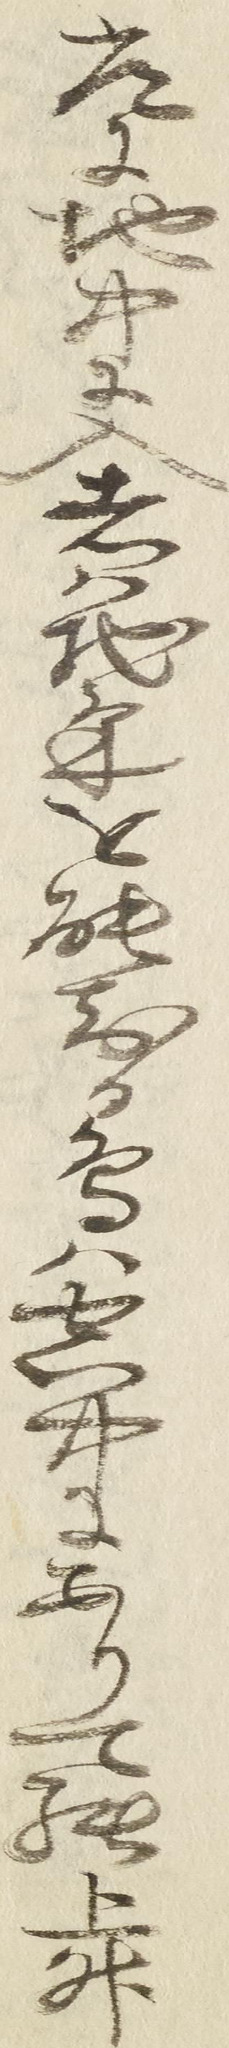常に地中に入者は地気をよくしる鳥は空中にありて能上升
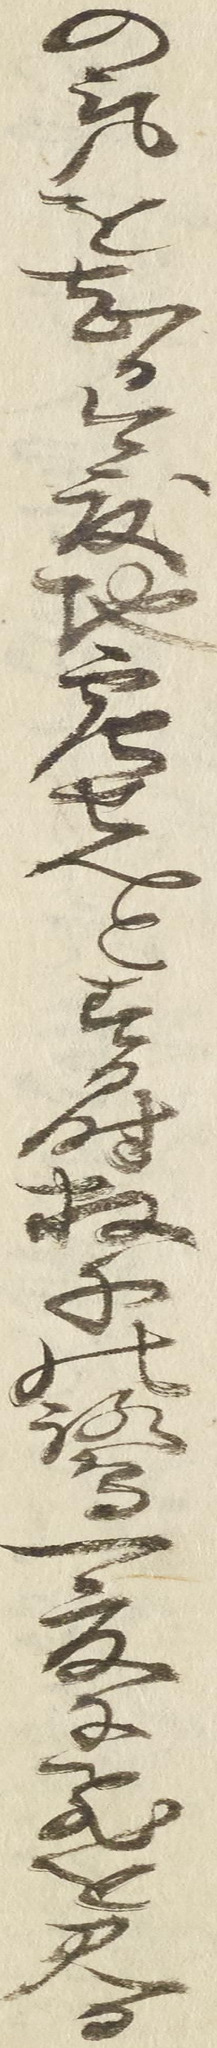の気をしる今度地震せんとする時数千の鷺一度に飛を見る
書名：地震記　下
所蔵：東京大学地震研究所図書室 Earthquake Research Institute Library, The University of Tokyo, JAPAN
